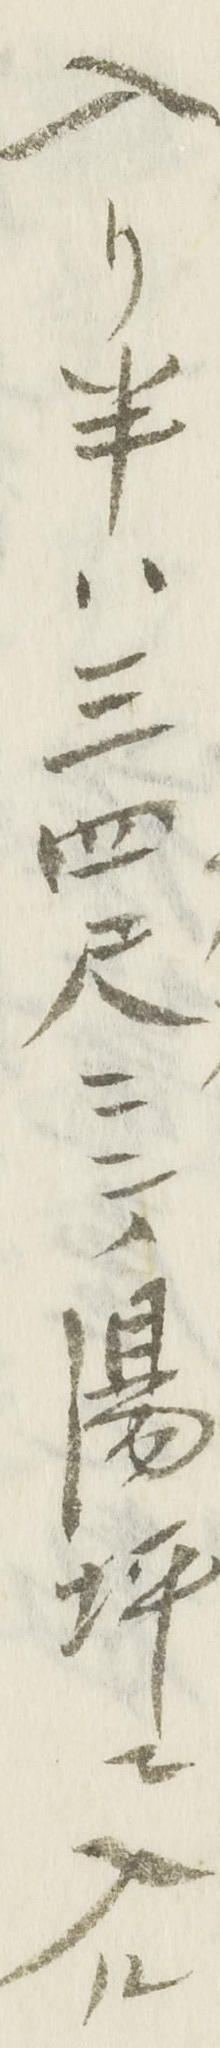入リ半ハ三四尺ニテ湯坪―ニ入ル
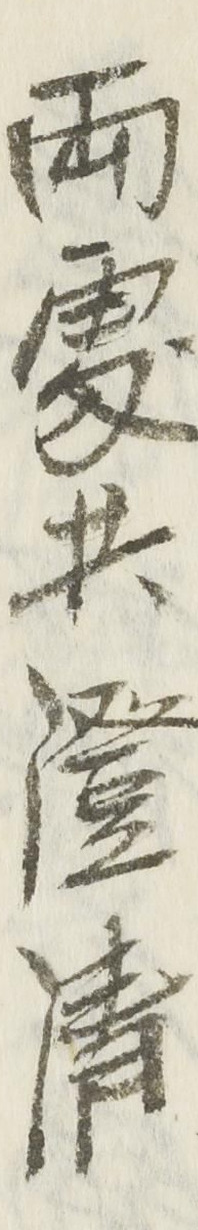両処共澄清
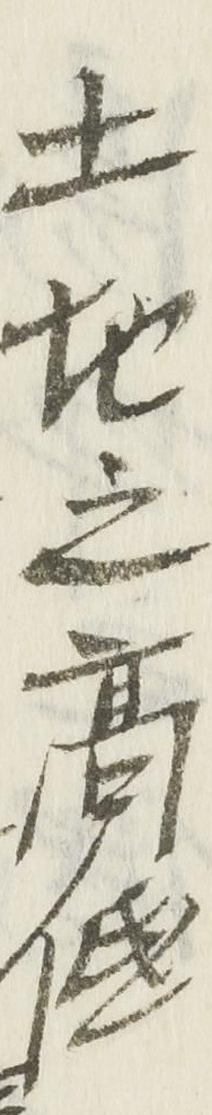土地之高低
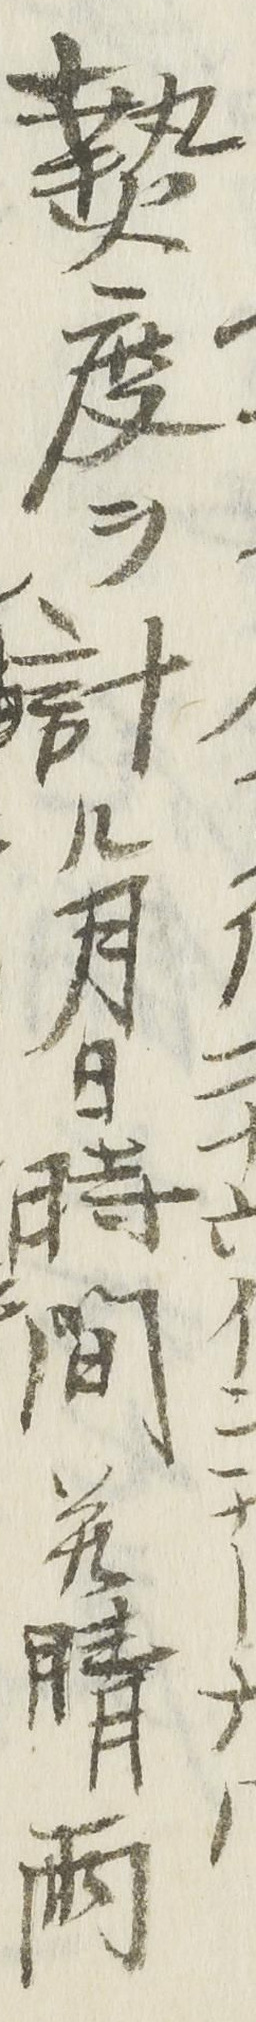熱度ヲ計ル月日時間幷晴雨
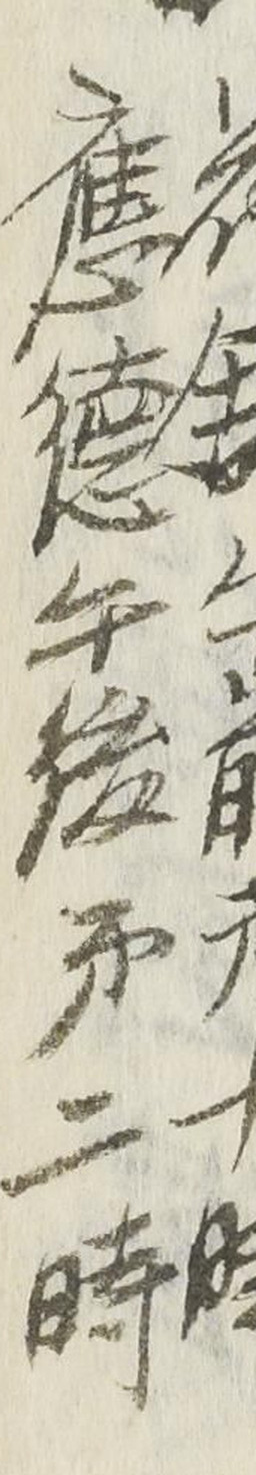応徳午後第二時晴

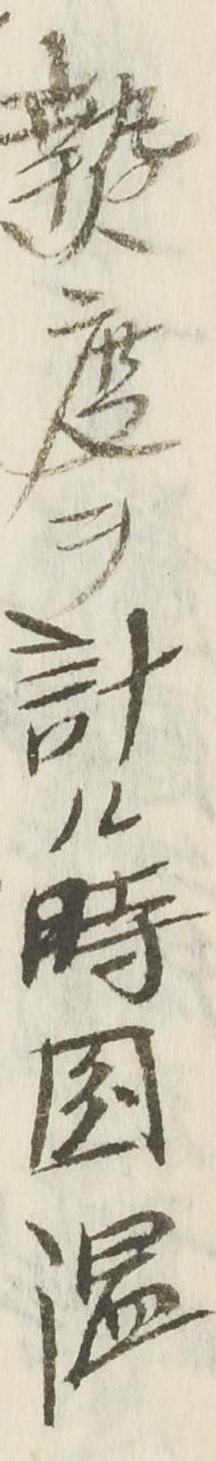熱度ヲ計ル時分温
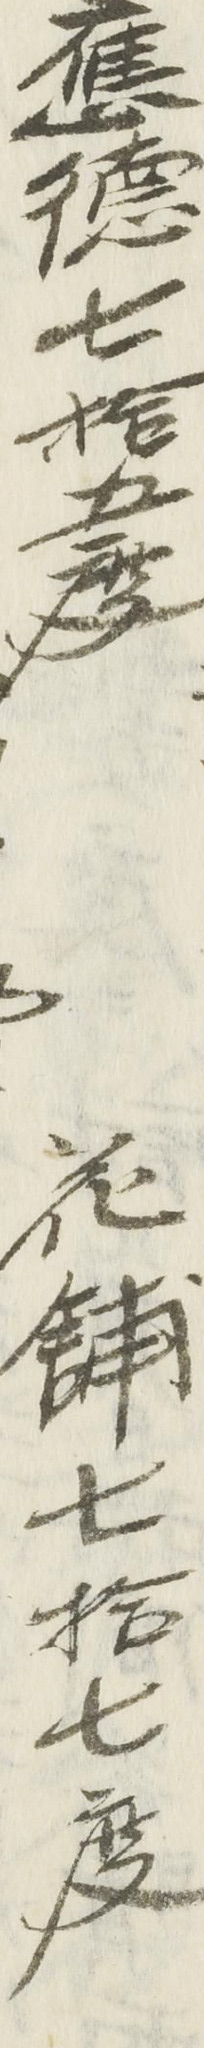応徳七拾五度花鋪七拾七度
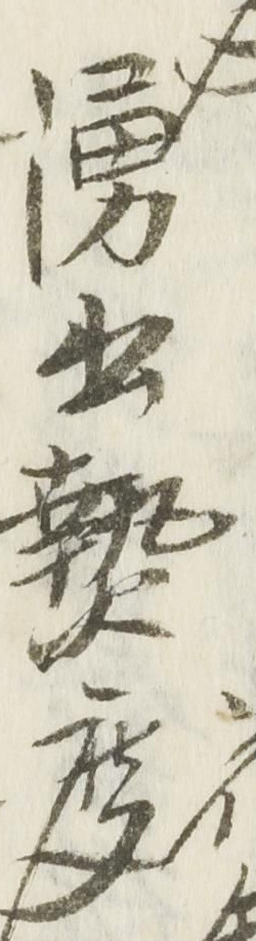湧出熱度
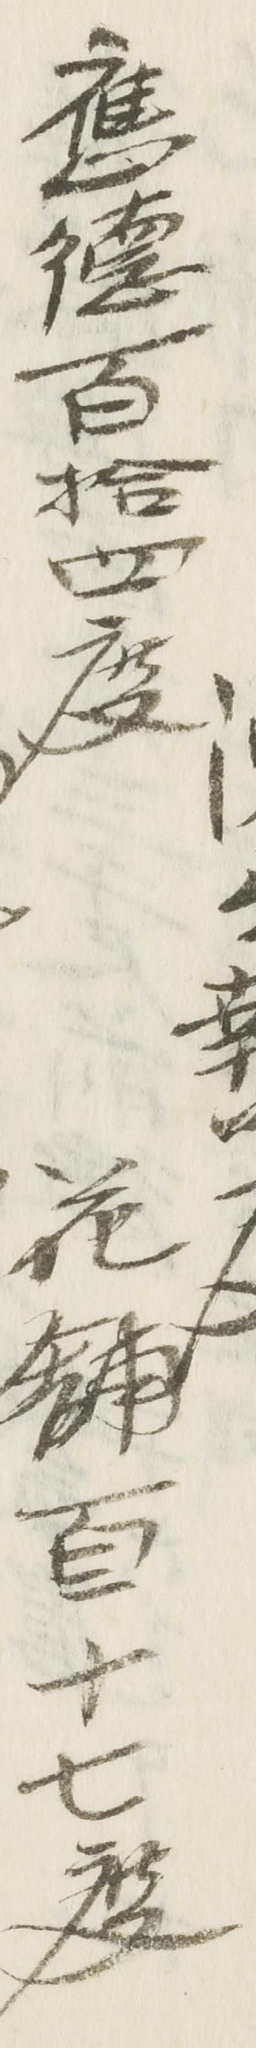応徳百拾四度花鋪百十七度
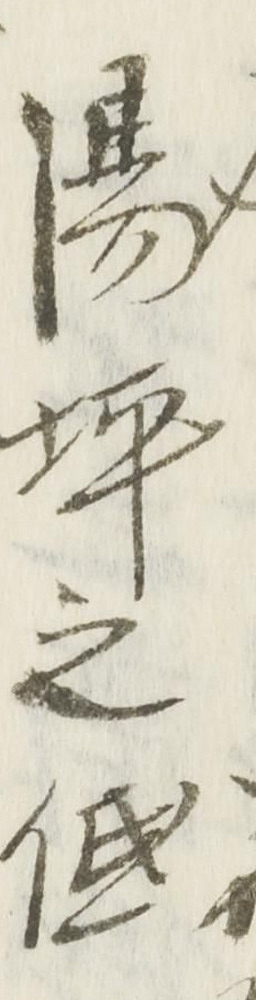湯坪之底
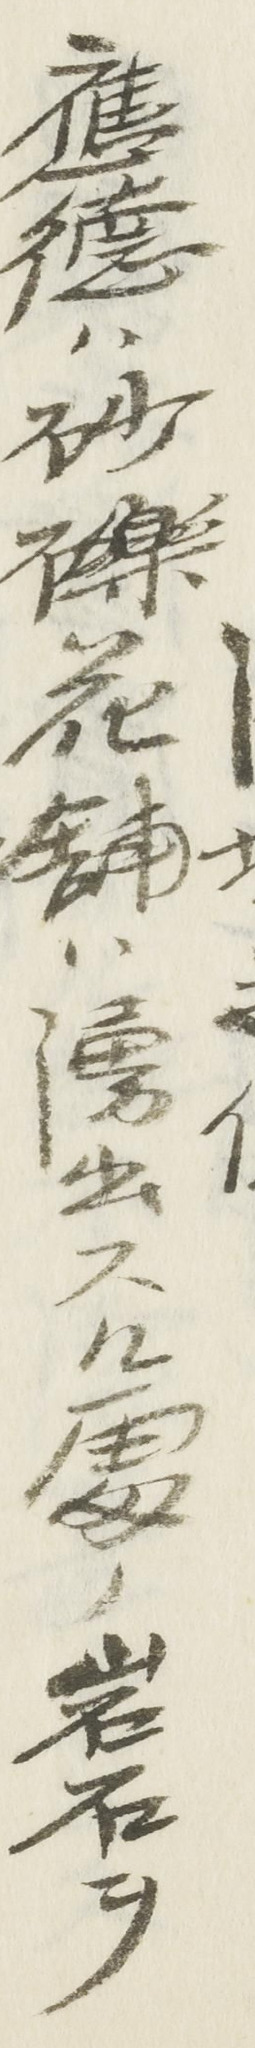応徳ハ砂礫花鋪ハ湧出スル処ノ岩石ヲ
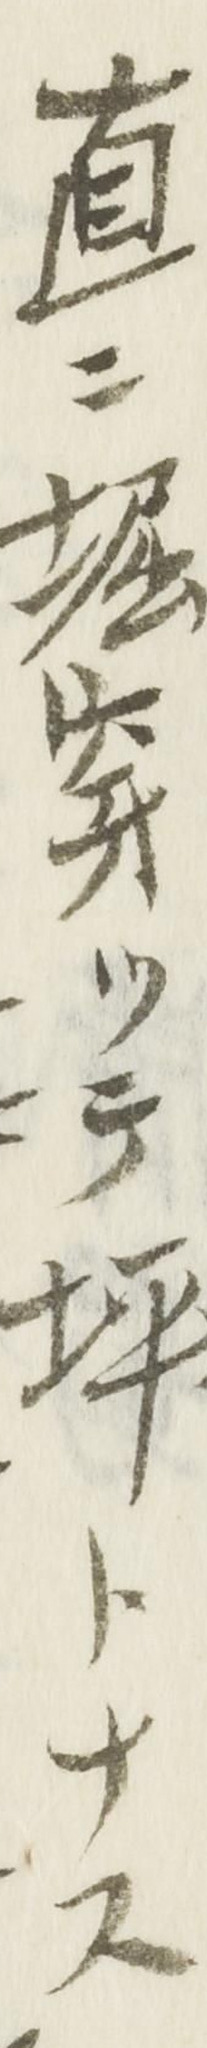直ニ堀穿ツテ坪トナス
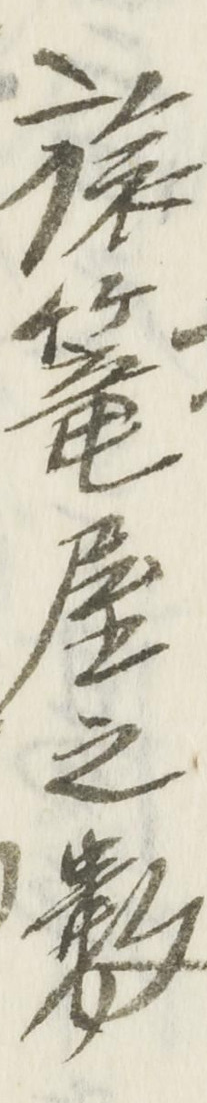旅籠屋之数
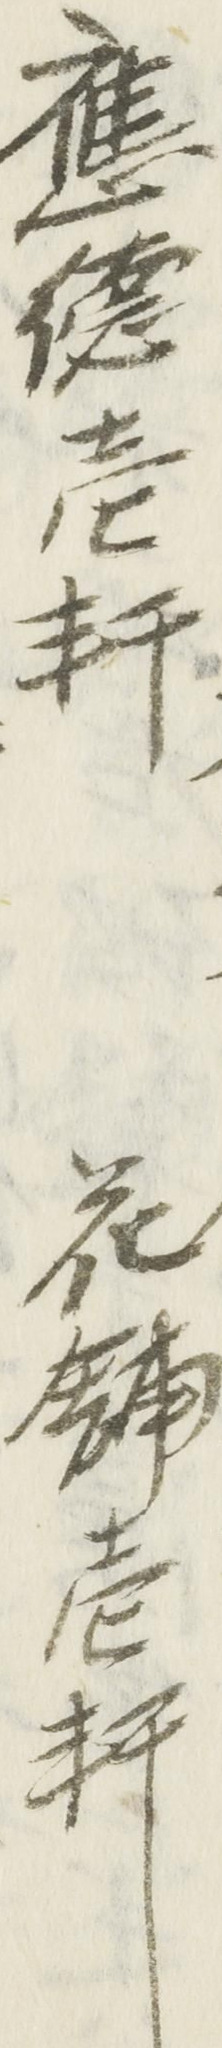応徳壱軒花鋪壱軒
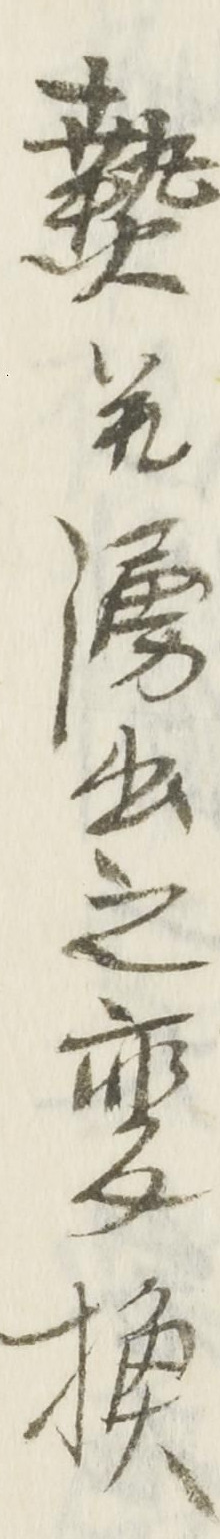熱并湧出之変換
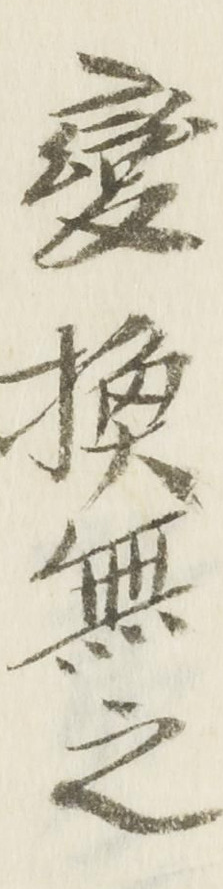変換無之
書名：温冷泉試験表
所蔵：東京大学地震研究所図書室 Earthquake Research Institute Library, The University of Tokyo, JAPAN
